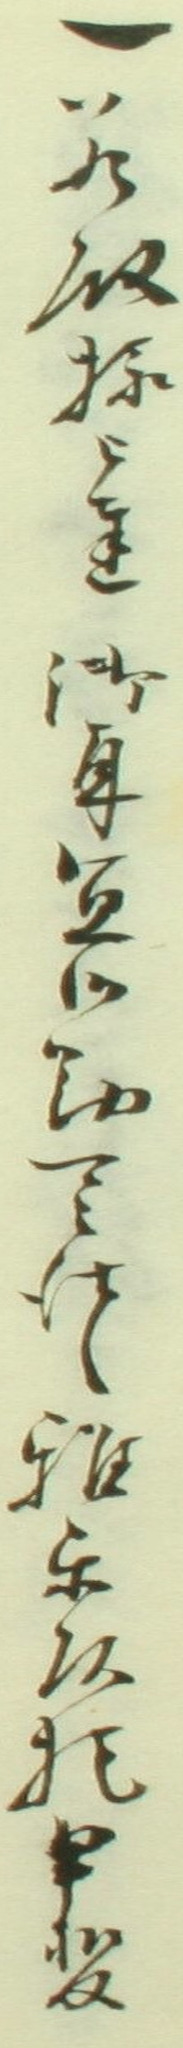一若殿様被達御耳宜御勤可被仕候雅楽頭様甲斐
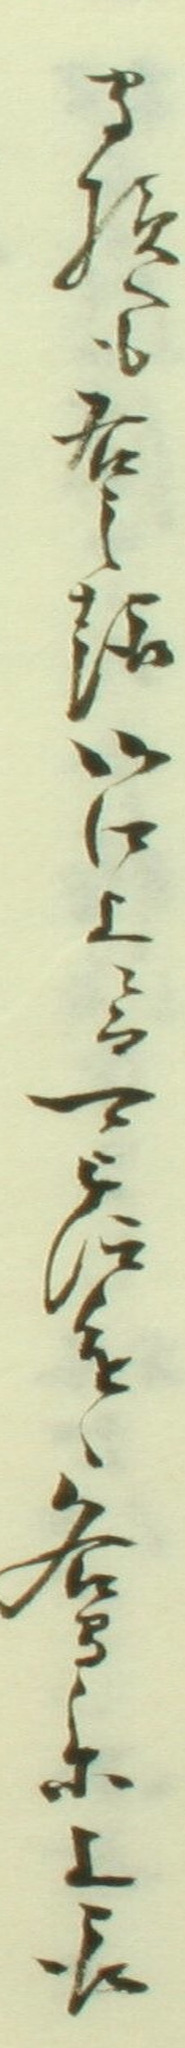守様へも右之趣御口上ニ而可被仰進候各守参上取
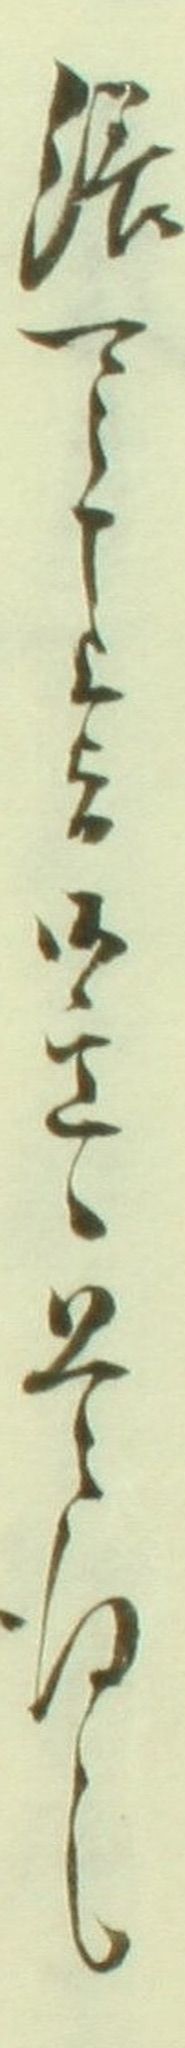繕可被申上旨御意候恐々謹言
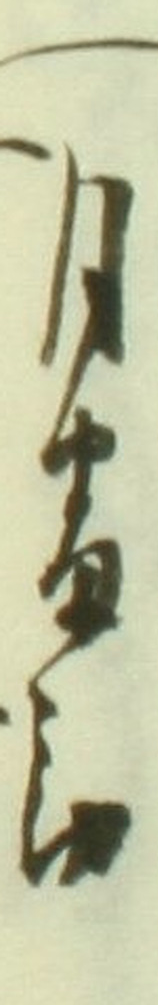月番勤
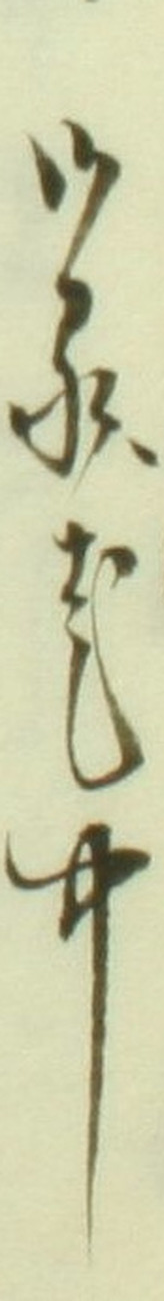御家老中
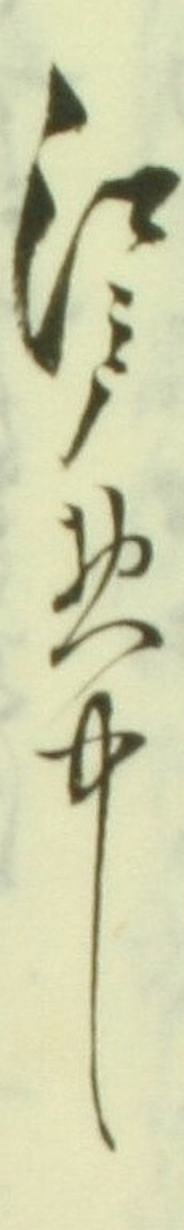江戸惣中
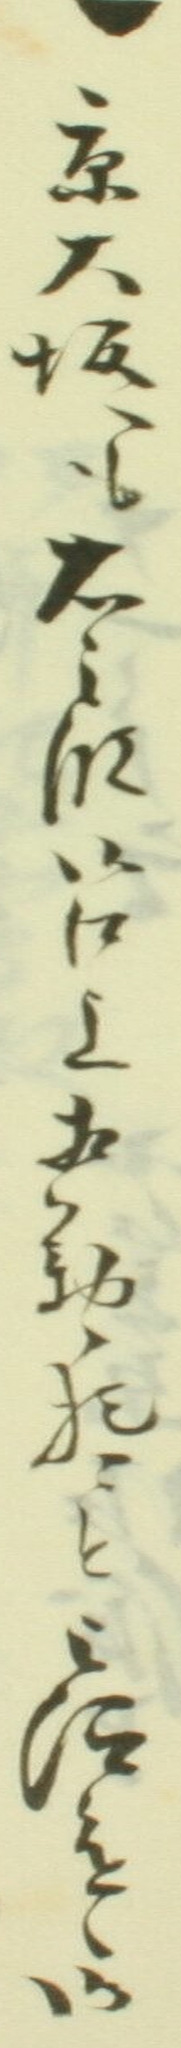一京大坂へも右之段御口上相勤候様ニと被仰進候御
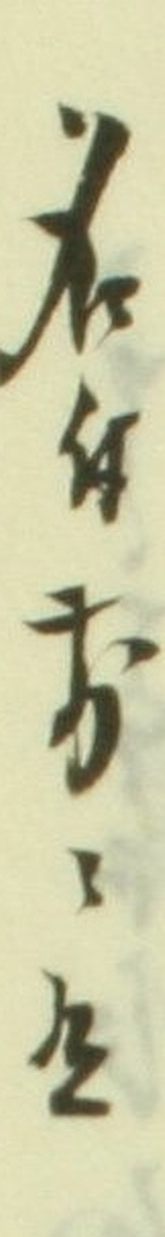名付前ニ有
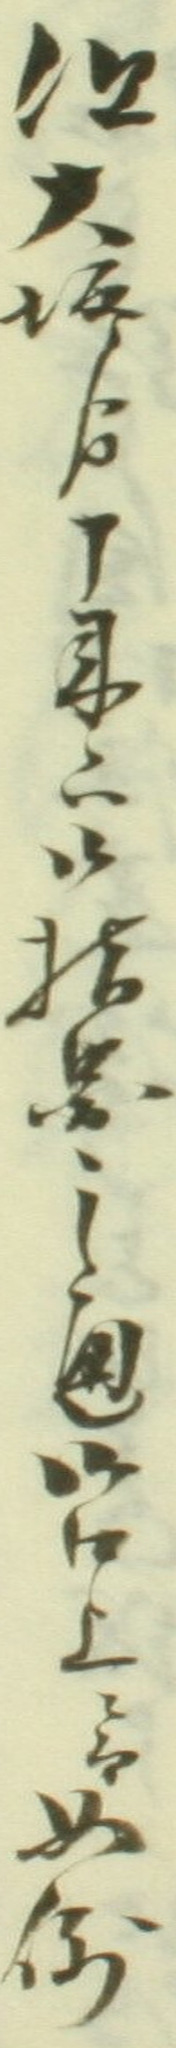但大坂ゟ申来候ハ御指図之通御口上ニ而如例
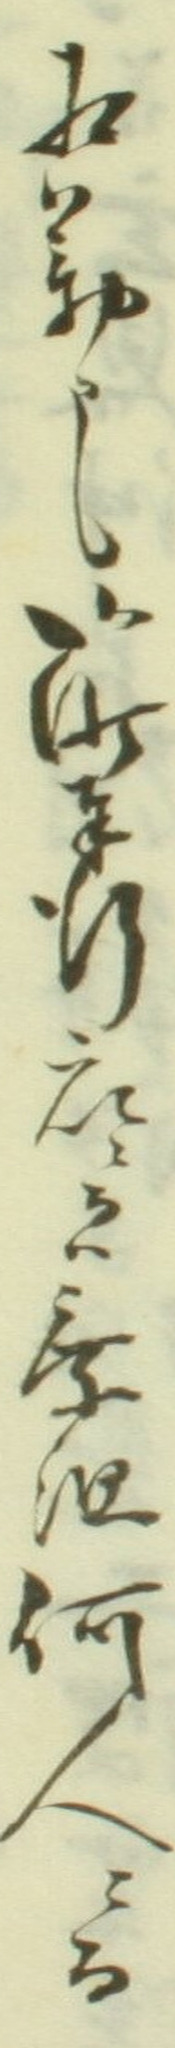相勤申候御町奉行衆ニ而ハ乗組何人ニ而
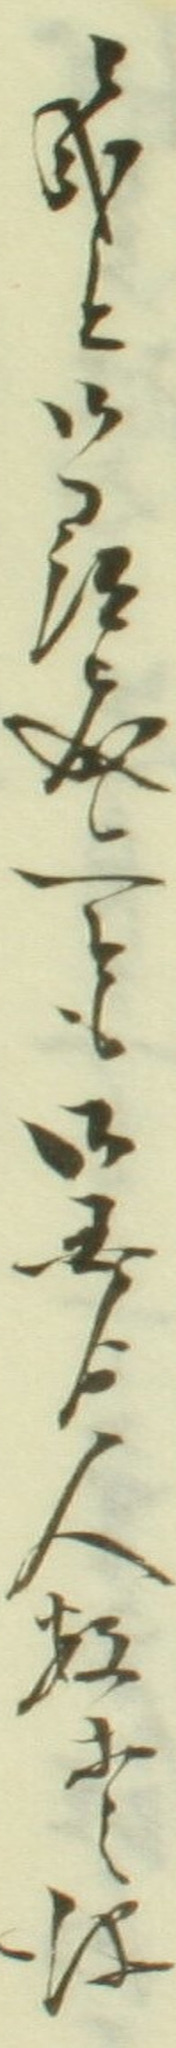候哉と御尋被成候へとも御国ゟ人数等之儀
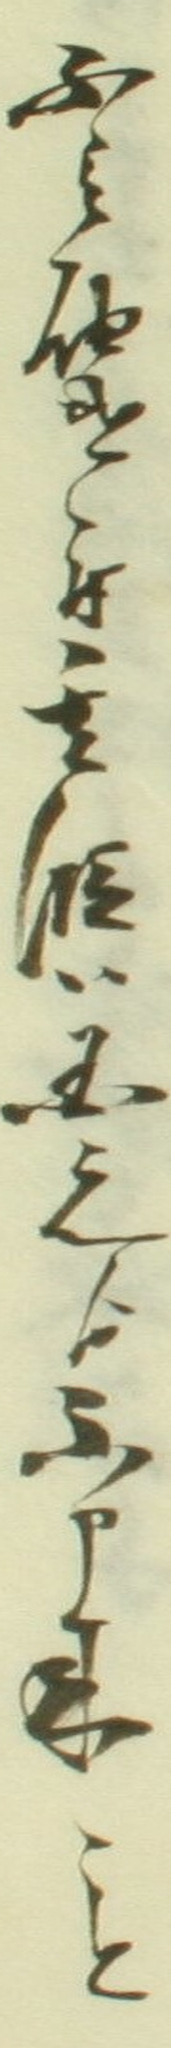不被届遣候付其段ハ国元ゟ不申来候と
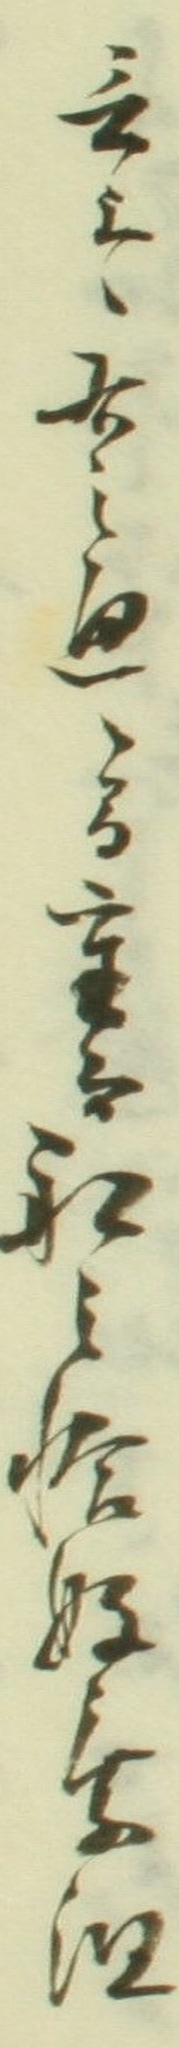言上候右之通候間重而船之恰好乗組
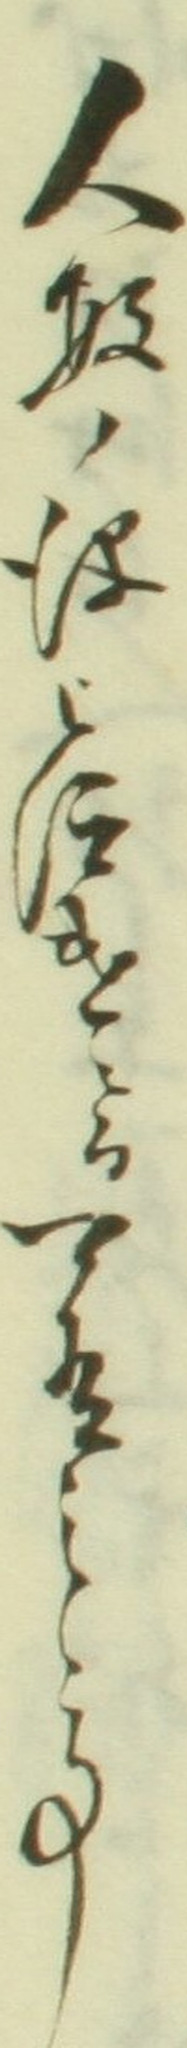人数ノ儀被仰遣ニ而可有之候事
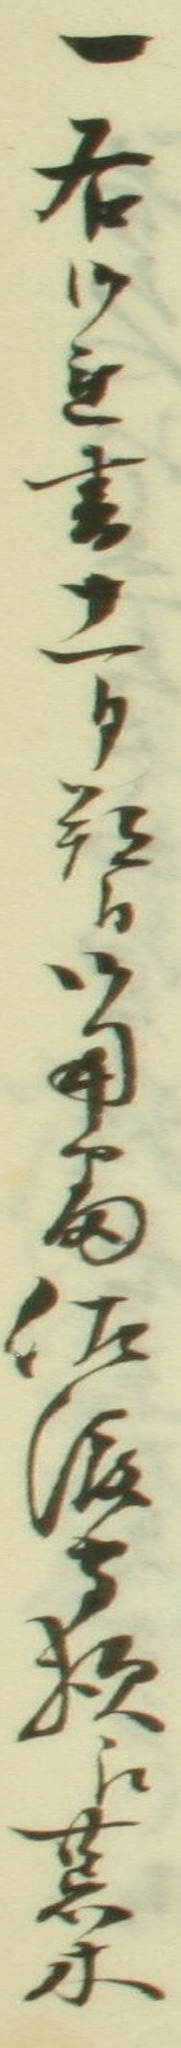一右御連書十一月朔日御用番佐渡守様江荒木

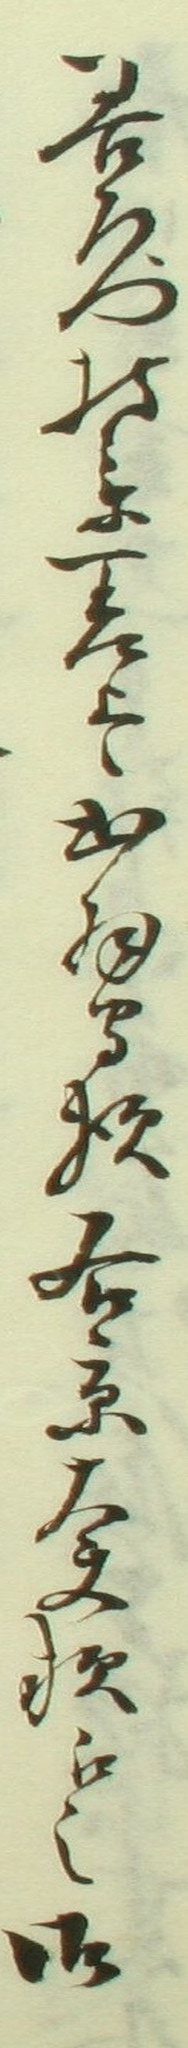善右衛門持参差上候出羽守様右京大夫様江之御
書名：異国船漂着記
